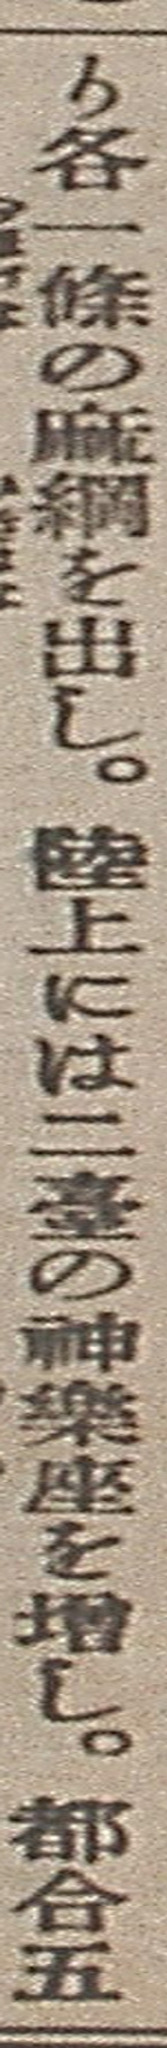り各一条の麻綱を出し。陸上には二台の神楽座を増し。都合五
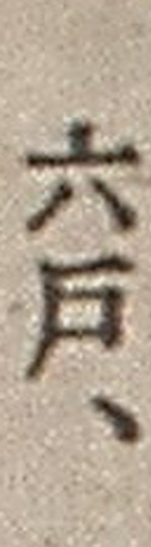六戸、
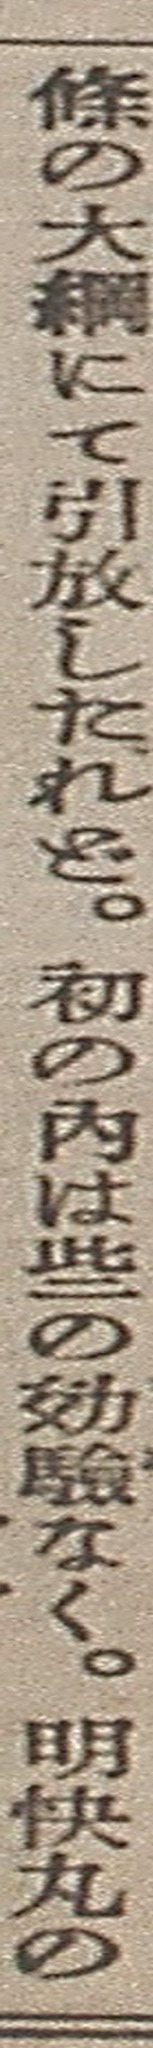条の大綱にて引放したれど。初の内は些の効験なく。明快丸の
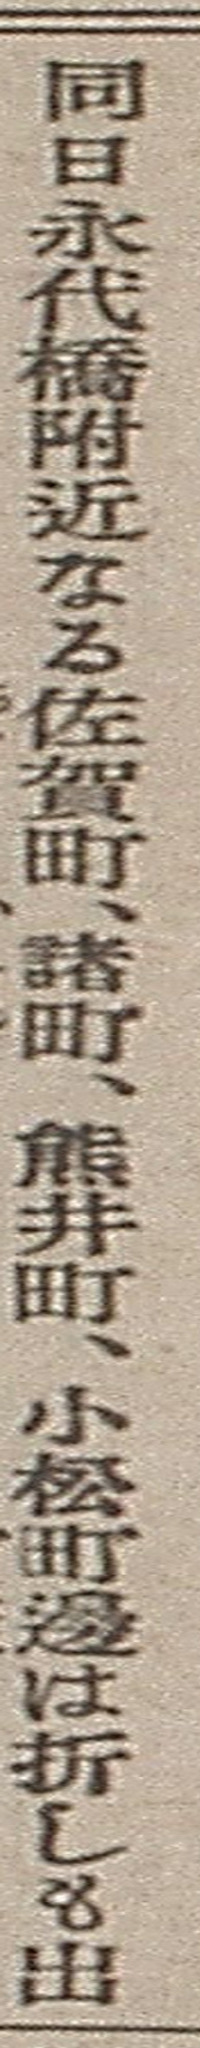同日永代橋付近なる佐賀町、諸町、熊井町、小松町辺は折しも出
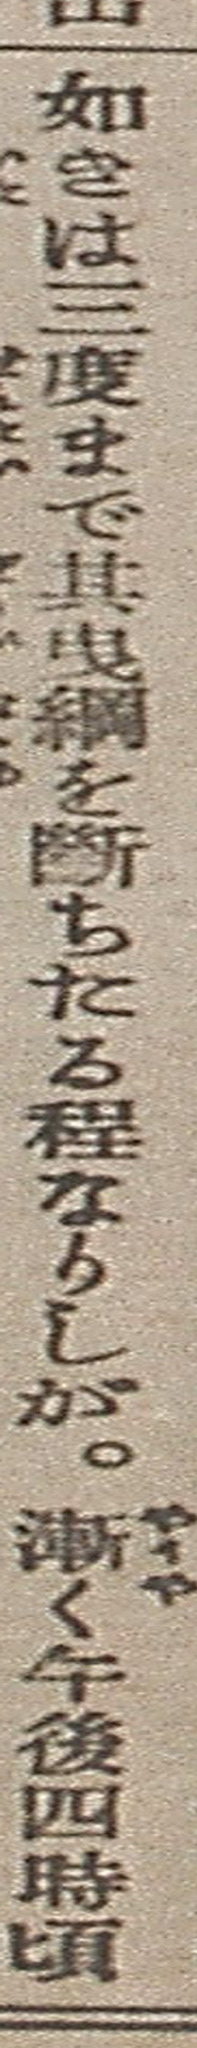如きは三度まで其曳綱を断ちたる程なりしが。漸く午後四時頃
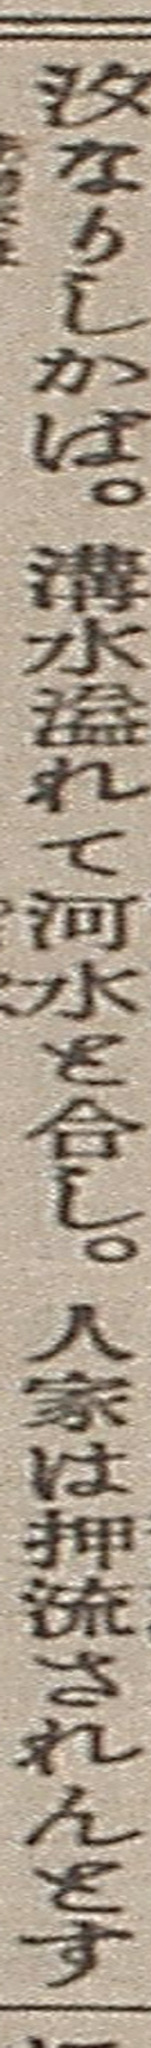汐なりしかば。溝水溢れて河水と合し。人家は押流されんとす
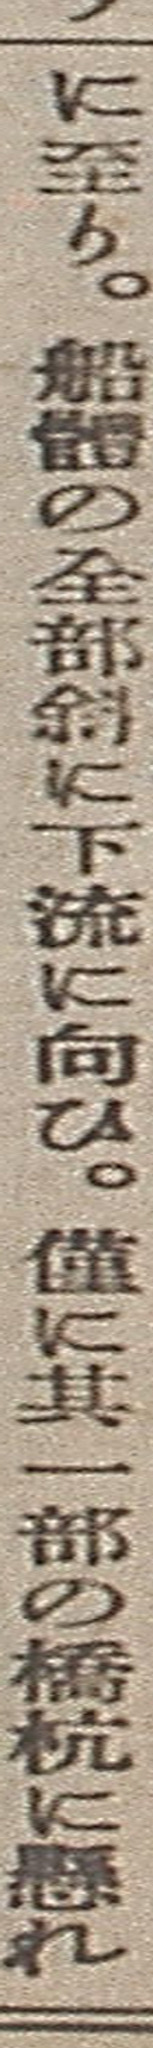に至り。船体の全部斜に下流に向ひ。僅に其一部の橋杭に懸れ
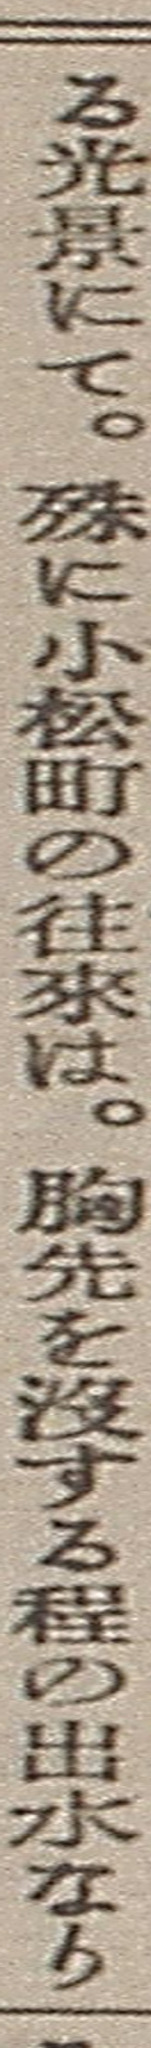る光景にて。殊に小松町の往来は。胸先を没する程の出水なり
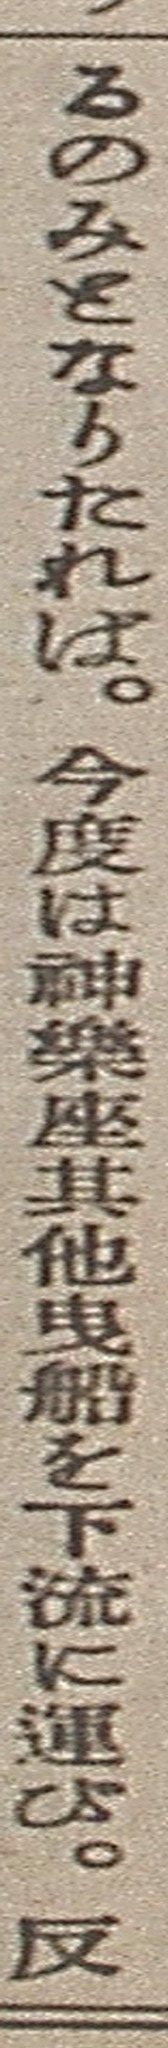るのみとなりたれば。今度は神楽座其他曳船を下流に運び。反
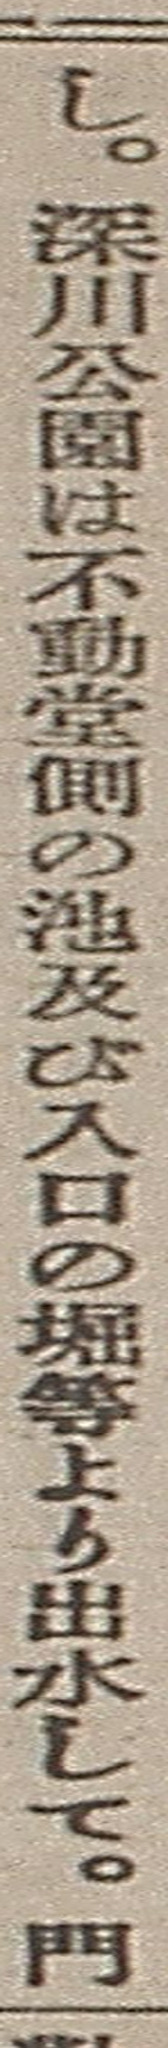し。深川公園は不動堂側の池及び入口の堀等より出水して。門
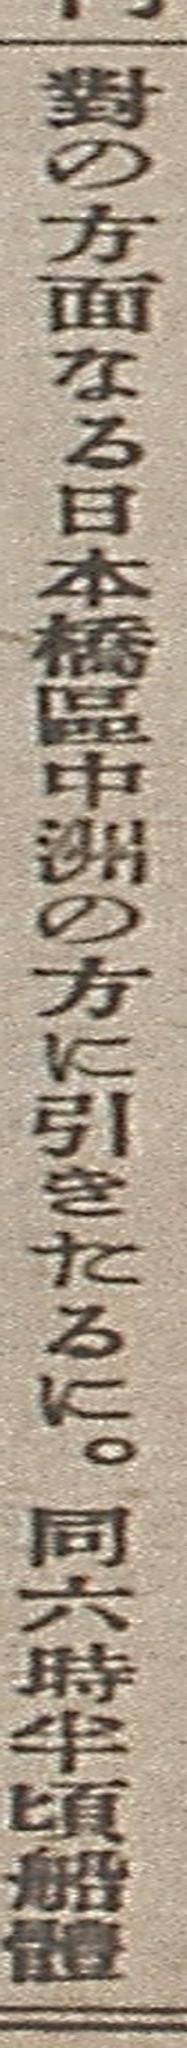対の方面なる日本橋区中洲の方に引きたるに。同六時半頃船体
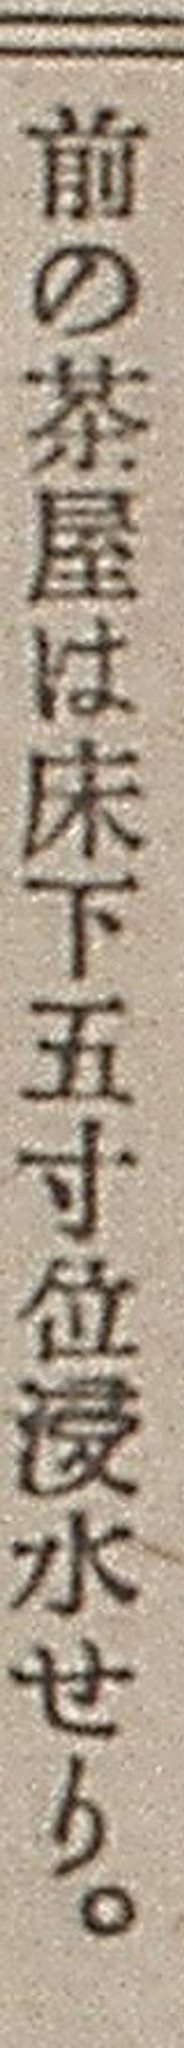前の茶屋は床下五寸位浸水せり。
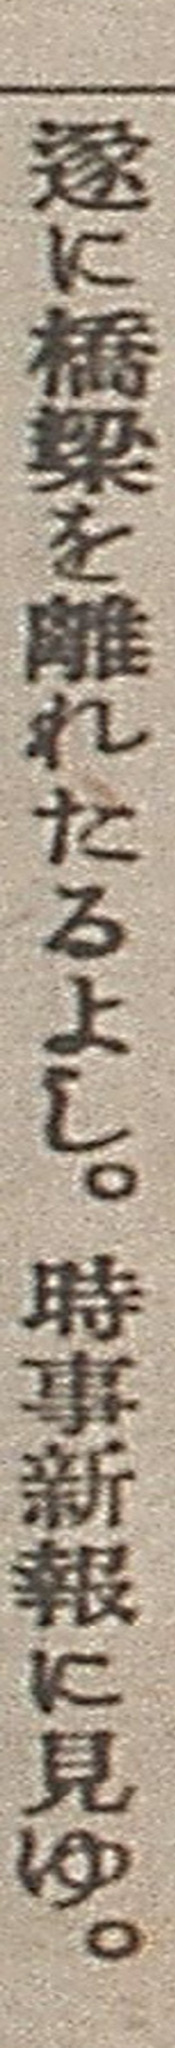遂に橋梁を離れたるよし。時事新報に見ゆ。
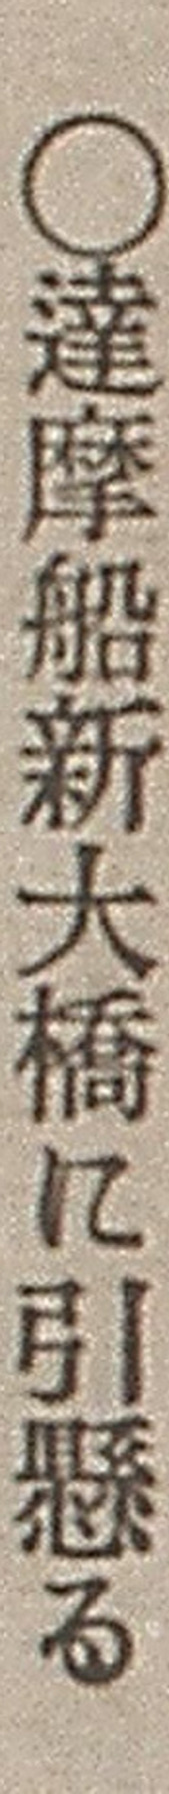〇達摩船新大橋に引懸る
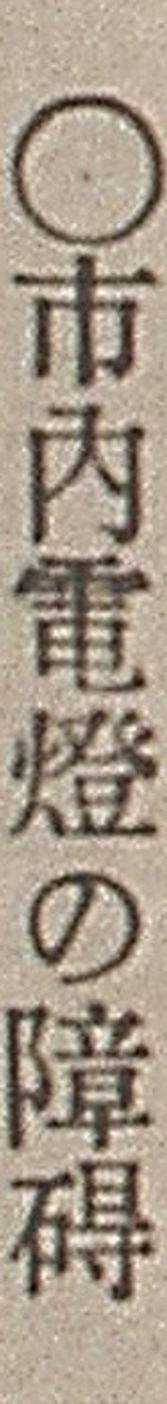〇市内電燈の障碍
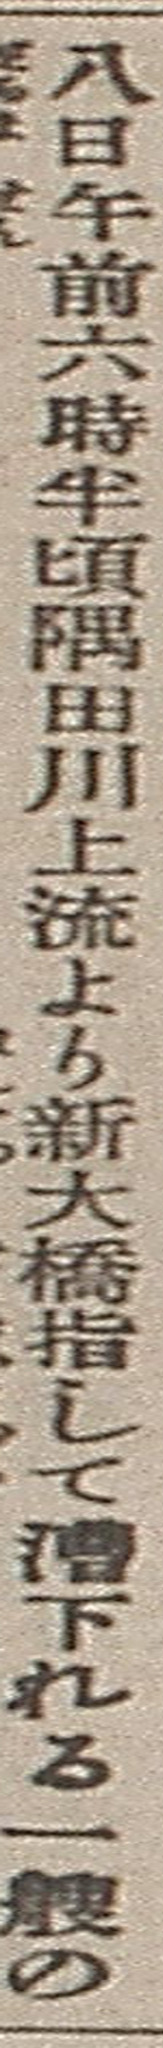八日午前六時半頃隅田川上流より新大橋指して漕下れる一艘の
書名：風俗畫報臨時増刊第百九十九號　明治三十二年十月各地災害圖會（前編之續）
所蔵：東京大学地震研究所図書室 Earthquake Research Institute Library, The University of Tokyo, JAPAN
